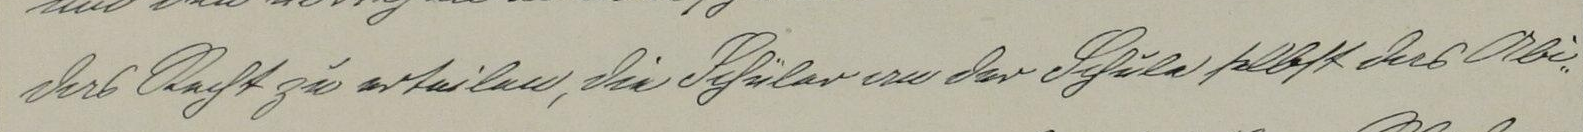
das Recht zu erteilen, die Schüler an der Schule selbst das Abi-
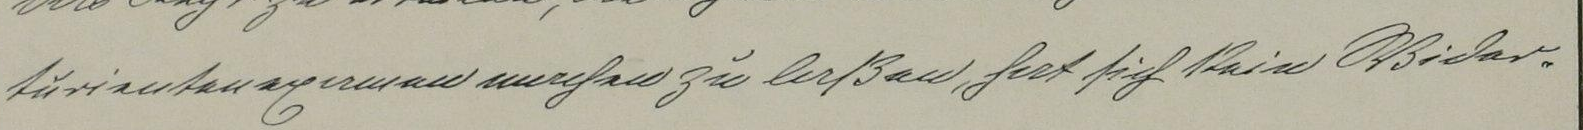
turientenexamen machen zu laßen, hat sich kein Wider-
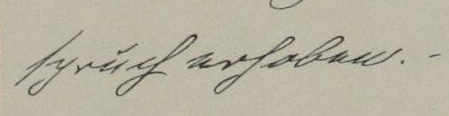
spruch erhoben.
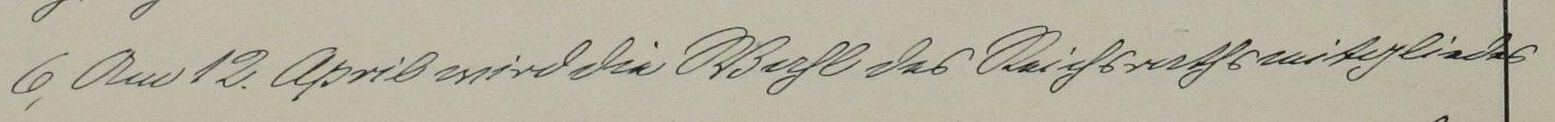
6. Am 12. April wird die Wahl des Reichsrathsmitgliedes
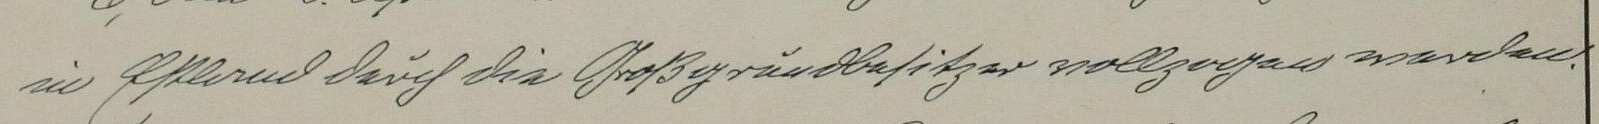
in Estland durch die Großgrundbesitzer vollzogen werden.
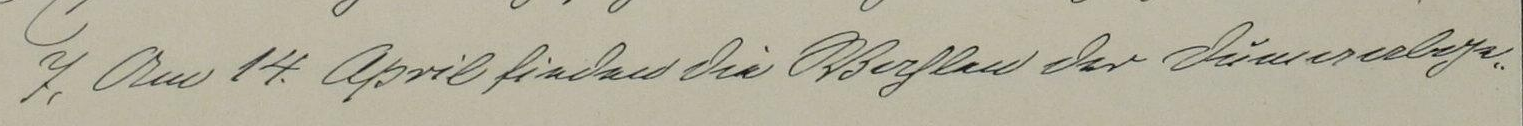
7. Am 14. April finden die Wahlen der Dumaabge-
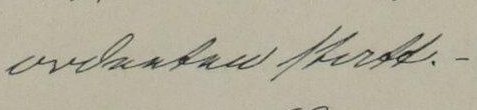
ordneten statt.
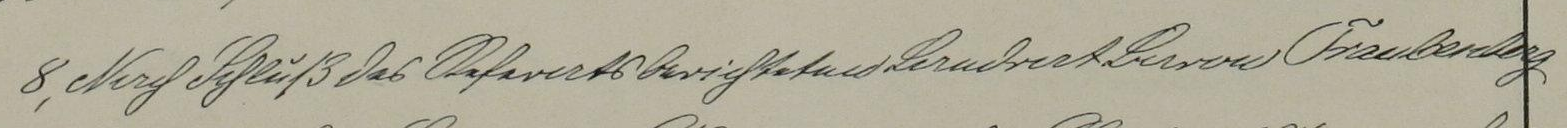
8. Nach Schluß des Referats berichteten Landrat Baron Traubenberg
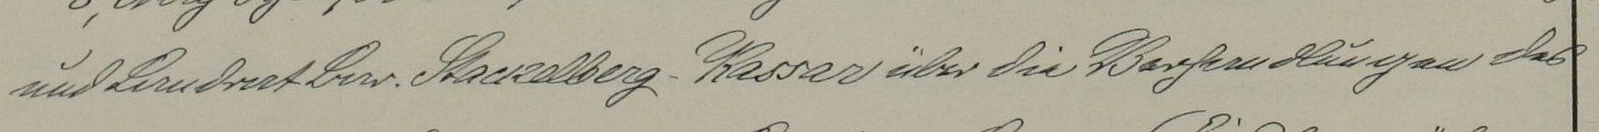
und Landrat Bar. Stackelberg-Kassar über die Verhandlungen des
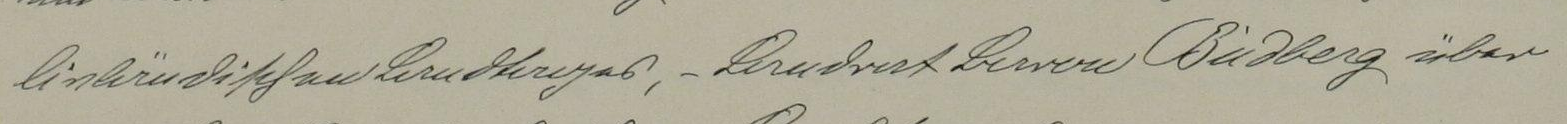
livländischen Landtages, Landrat Baron Budberg über
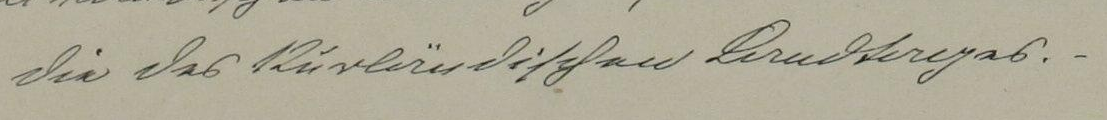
die des kurländischen Landtages.
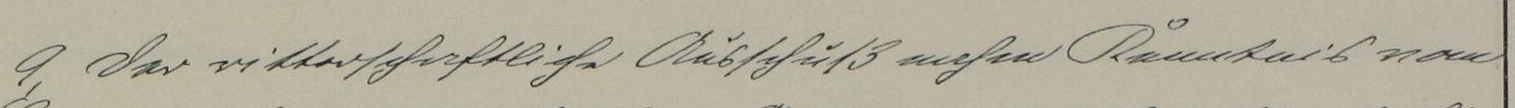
9. Der ritterschaftliche Ausschuß nahm Kenntnis vom
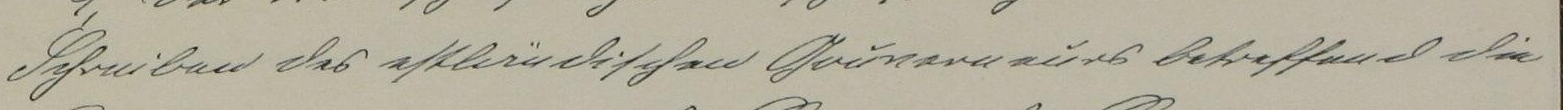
Schreiben des estländischen Gouverneurs betreffend die
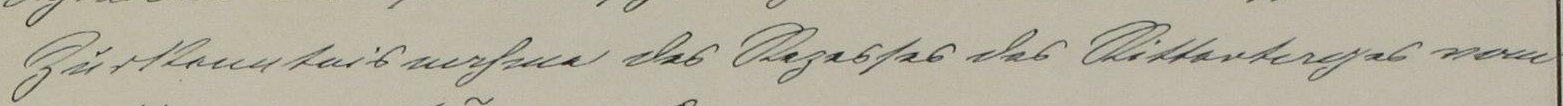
Zurkenntnisnahme des Rezesses des Rittertages vom
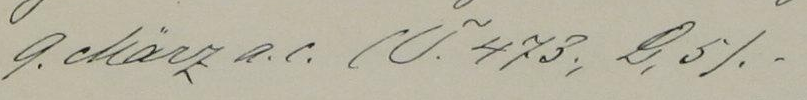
9. März a.c. (T.473; L.5)
